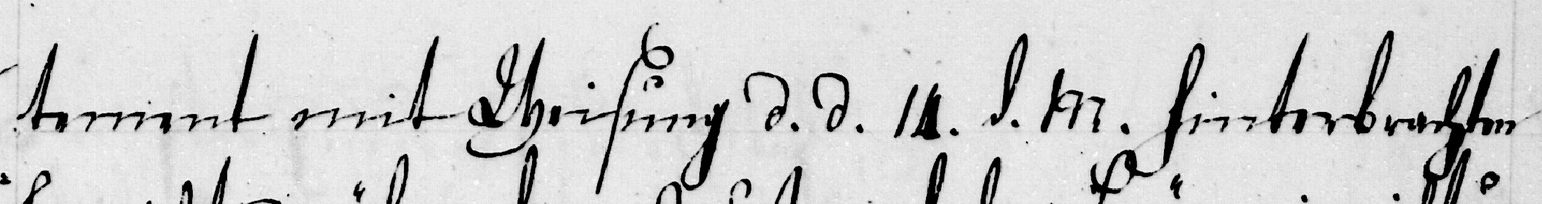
tement mit Weisung d. d. 14. d. M. hinterbrachten
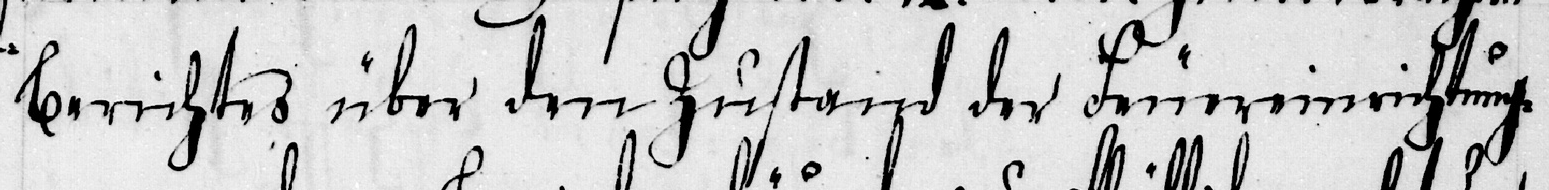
Berichtes über den Zustand der Feuereinrichtun¬
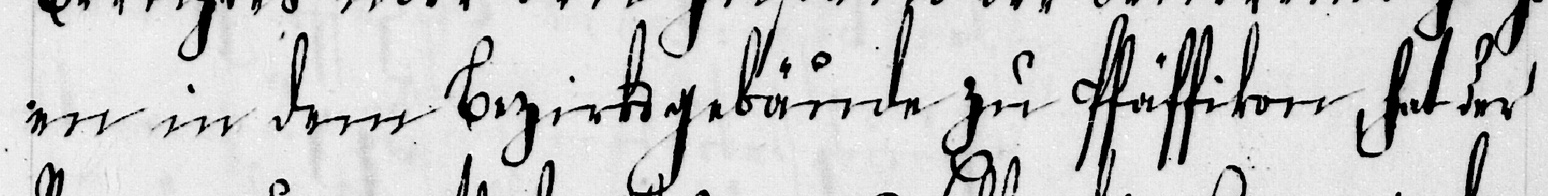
gen in dem Bezirksgebäude zu Pfäffikon, hat der
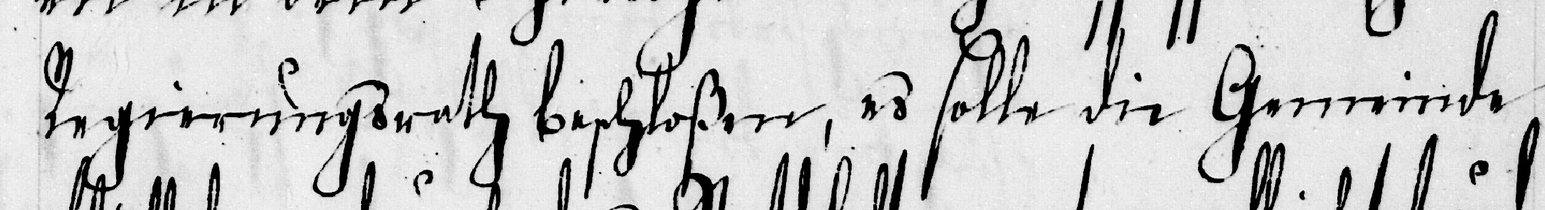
Regierungsrath beschloßen, es solle die Gemeinde
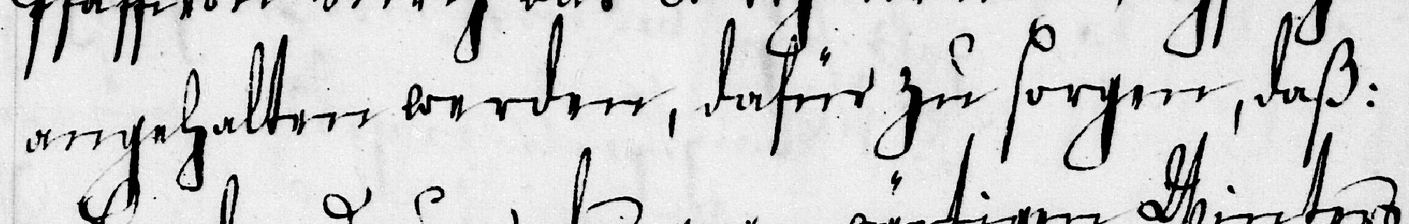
angehalten werden, dafür zu sorgen, daß:
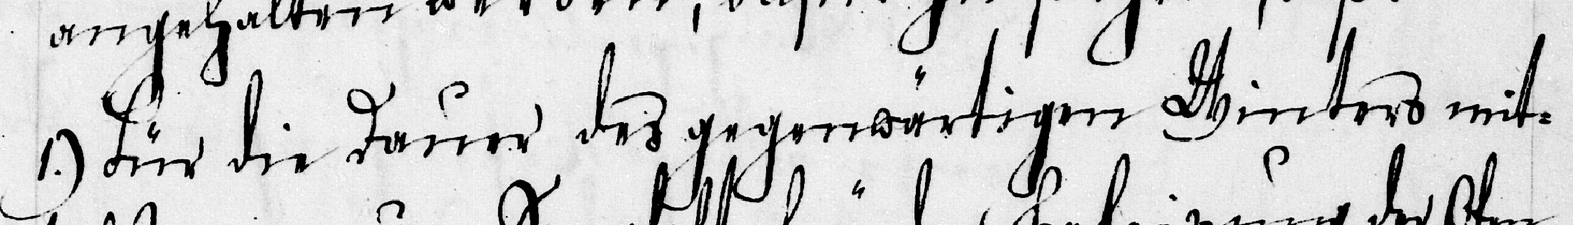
1.) Für die Dauer des gegenwärtigen Winters mit¬
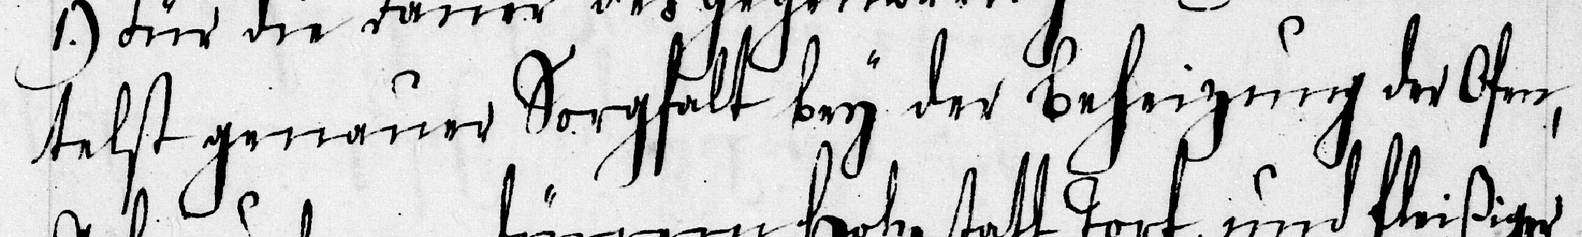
telst genauer Sorgfalt bey der Beheizung der Ofen,
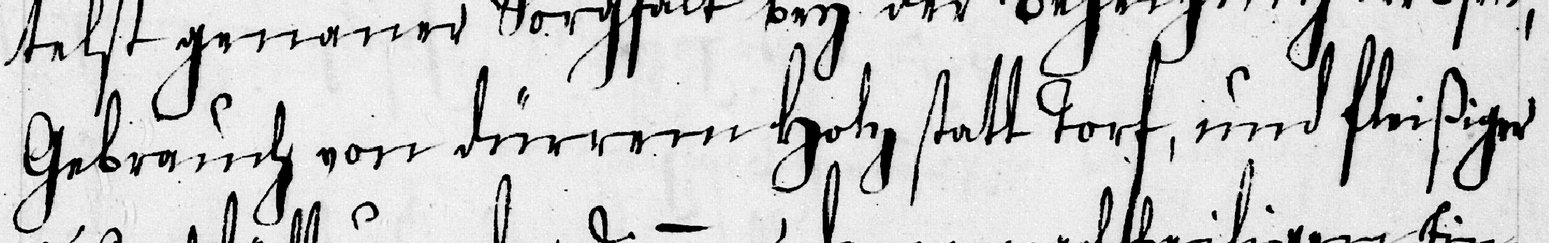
Gebrauch von dürrerem Holz statt Torf, und fleißiger
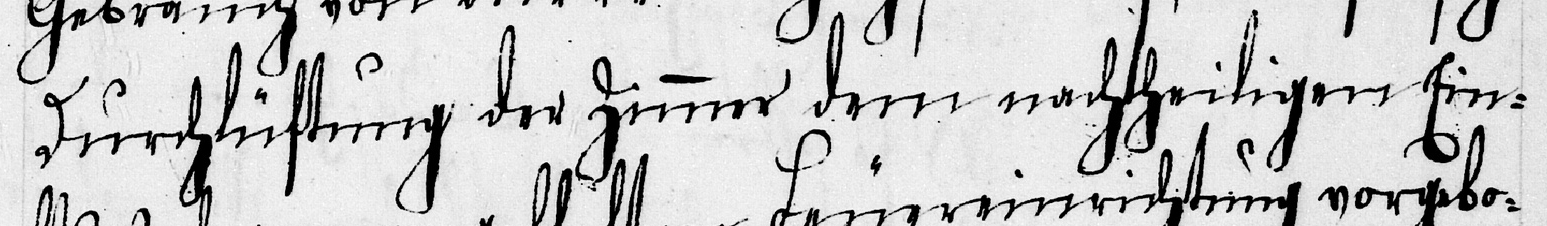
Durchlüftung der Zimmer dem nachtheiligen Ein¬
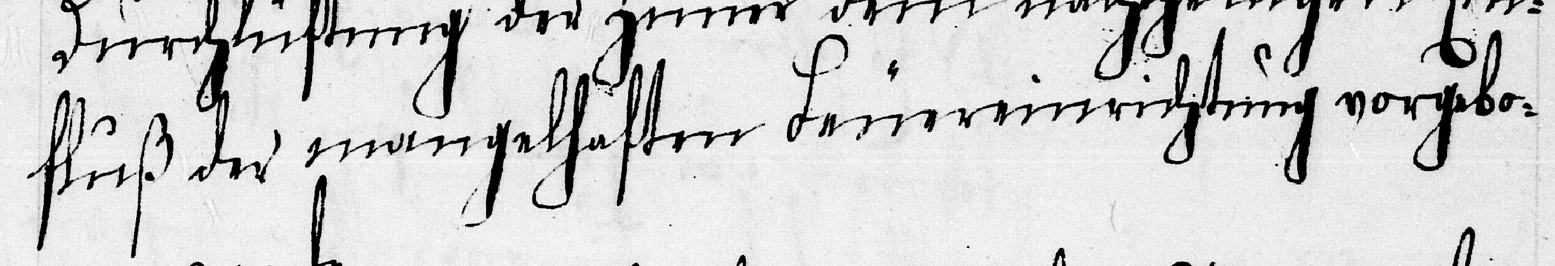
fluß der mangelhaften Feuereinrichtungen vorgebo¬
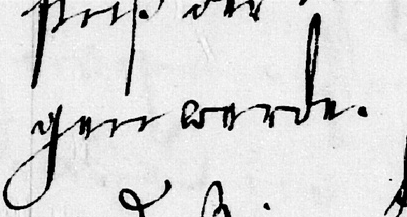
gen werde.
